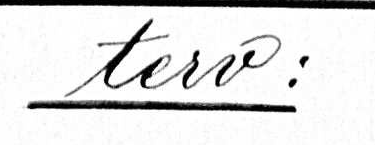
terv:
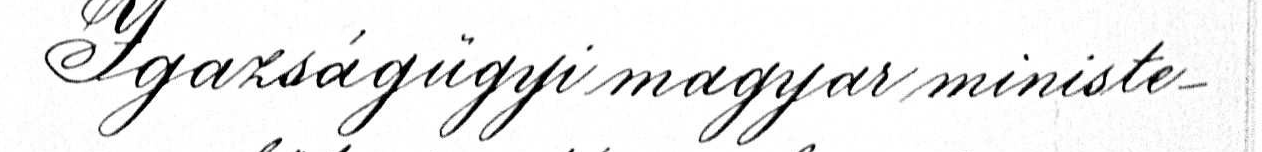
Jgazságügyi magyar ministe¬
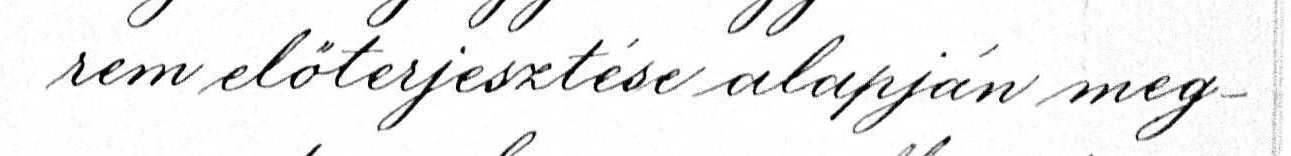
rem elöterjesztése alapján meg¬
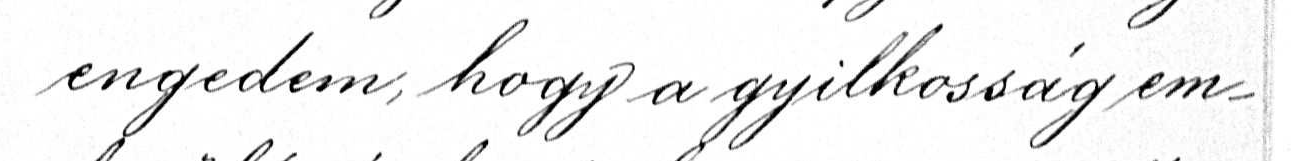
engedem, hogy a gyilkosság em¬
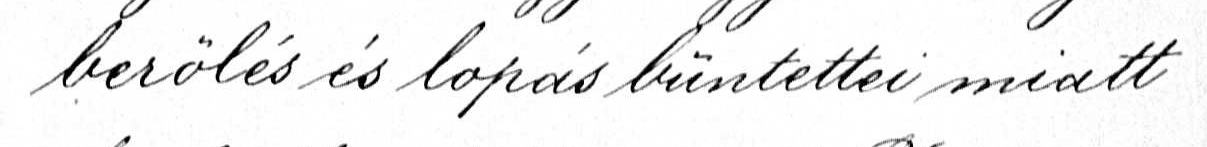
berölés és lopás büntettei miatt
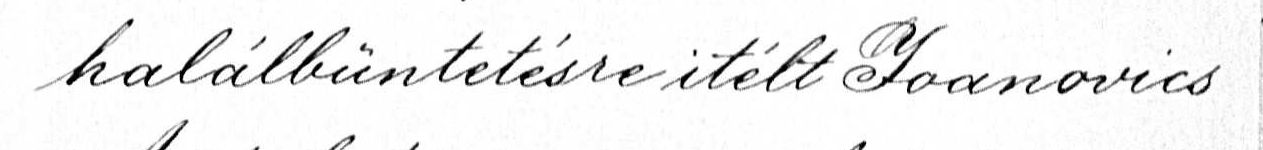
halálbüntetésre itélt Joanovics
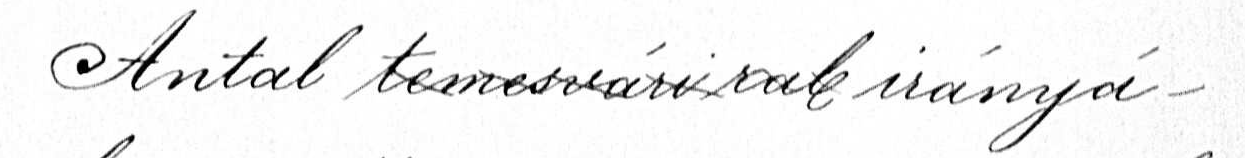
Antal irányá¬
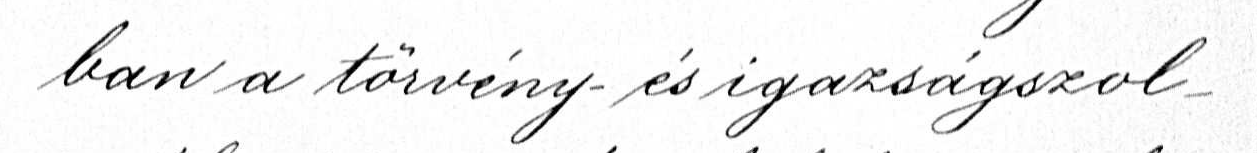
ban a törvéney- és igazságszol
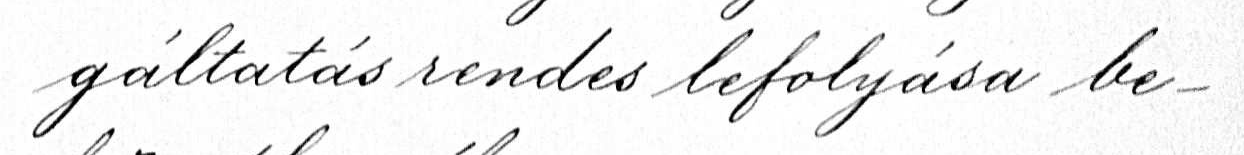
gáltatás rendes lefolyása be¬
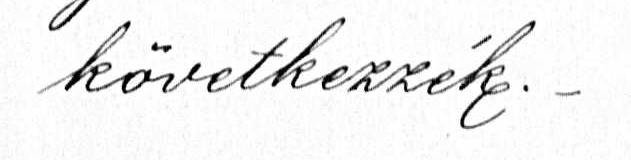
következzék.–
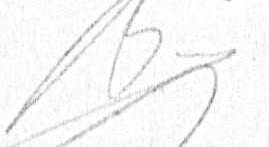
Gs.
